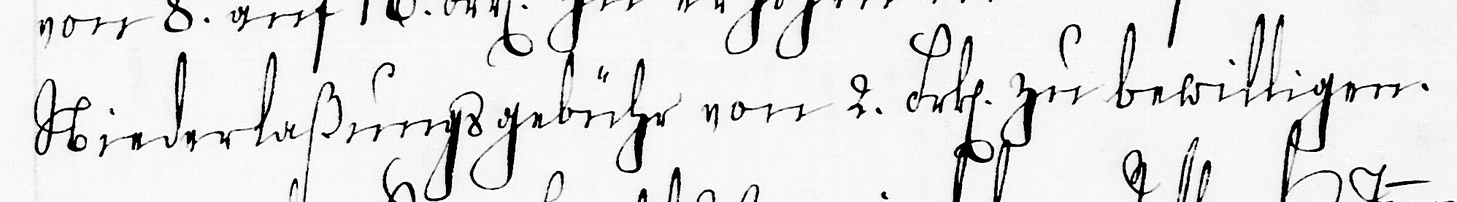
Niederlaßungsgebühr von 2. Frk[en]. zu bewilligen.
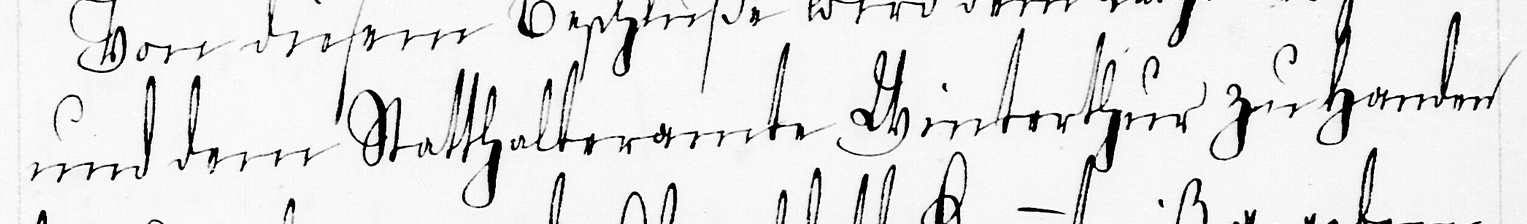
und dem Statthalteramte Winterthur zu Handen
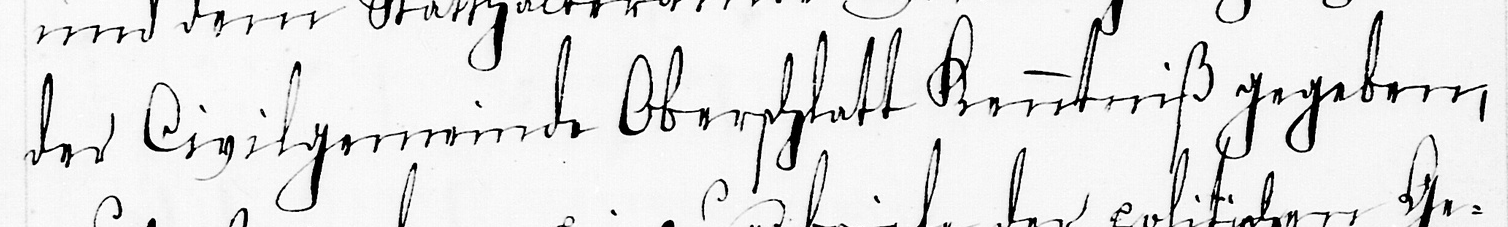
der Civilgemeinde Oberschlatt Kenntniß gegeben,
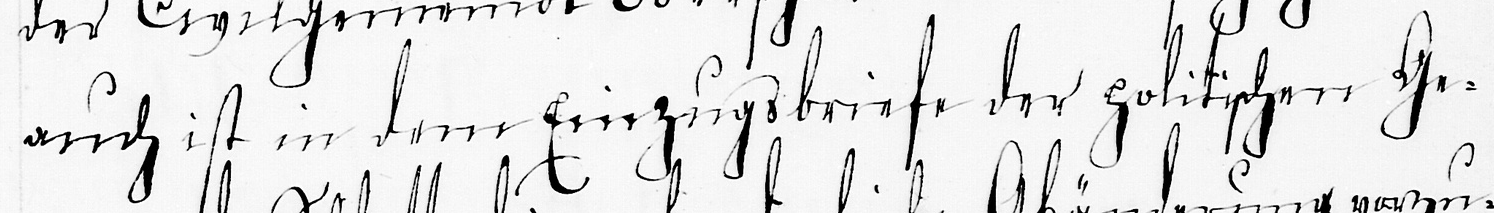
auch ist in dem Einzugsbriefe der politischen Ge¬
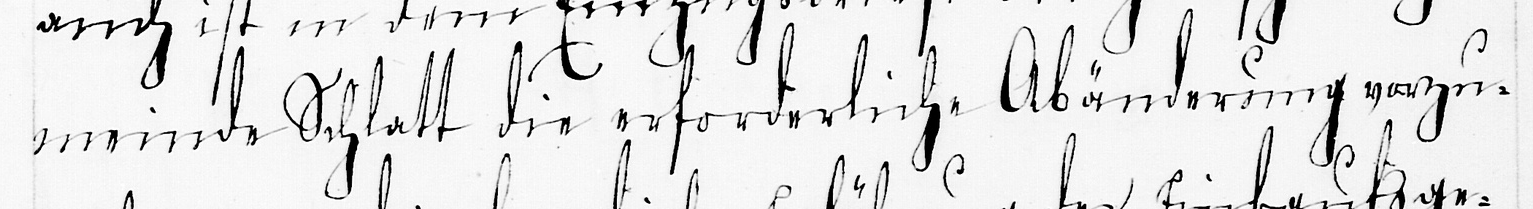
meinde Schlatt die erforderliche Abänderung vorzu¬
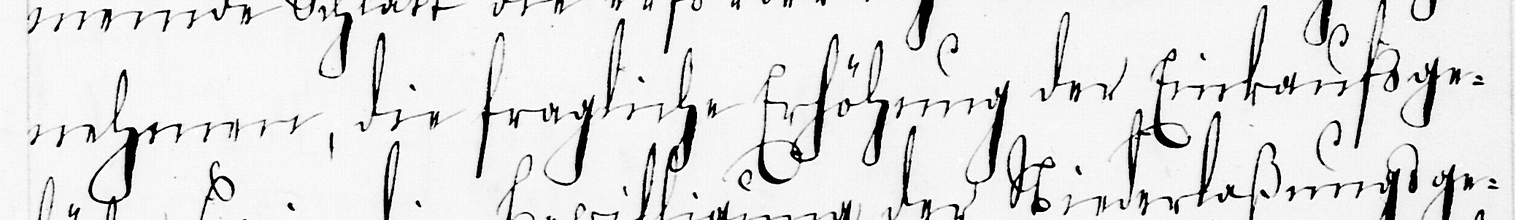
nehmen, die fragliche Erhöhung der Einkaufsge¬
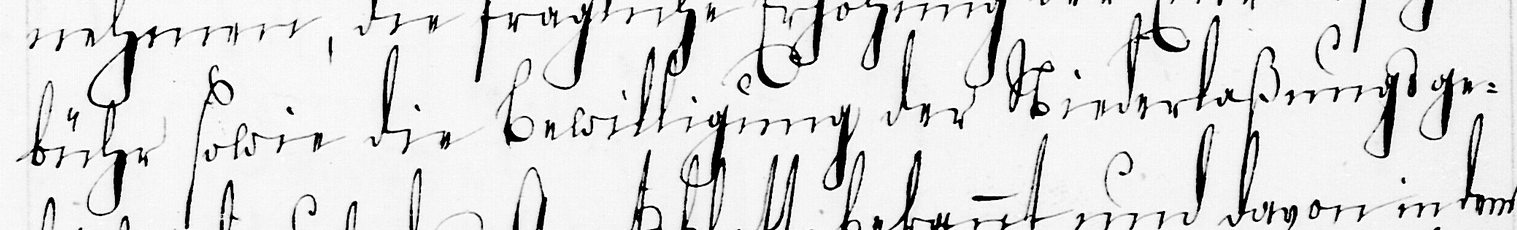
bühr sowie die Bewilligung der Niederlaßungsge¬
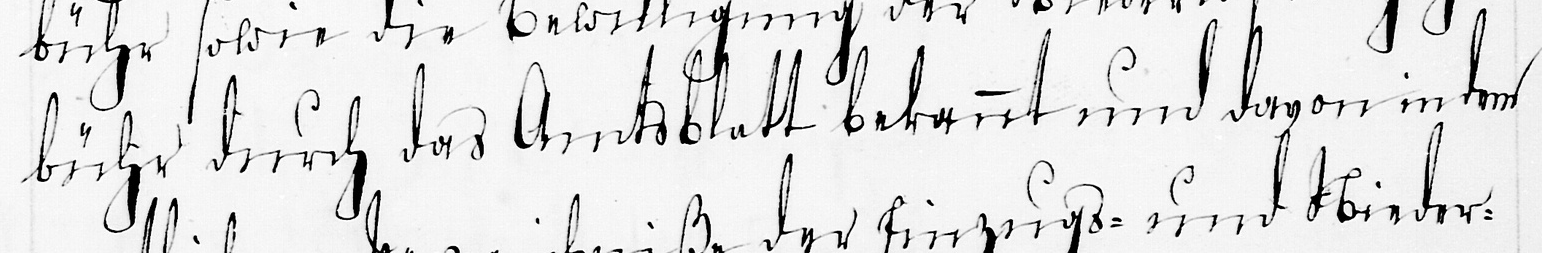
bühr durch das Amtsblatt bekannt und davon in dem
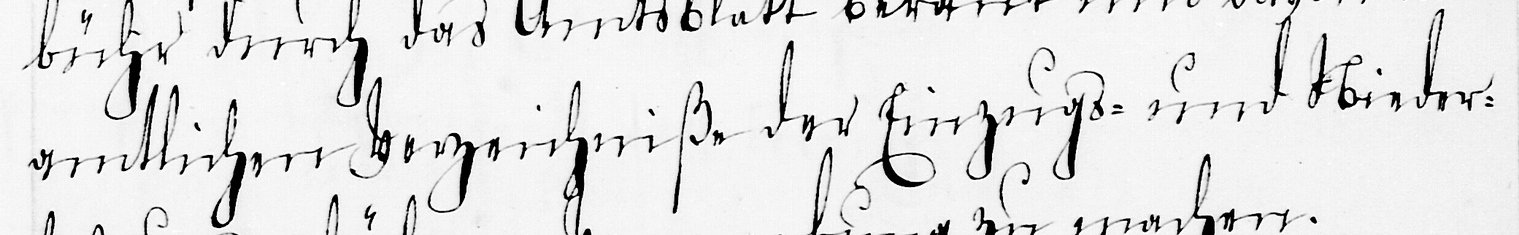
amtlichen Verzeichniße der Einzugs- und Nieder¬
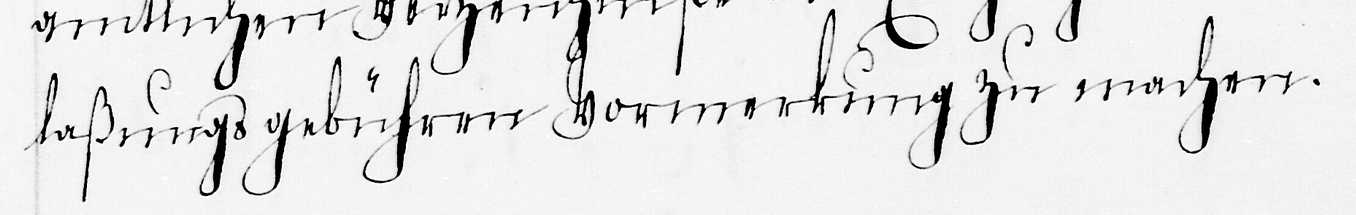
laßungsgebühren Vormerkung zu machen.
